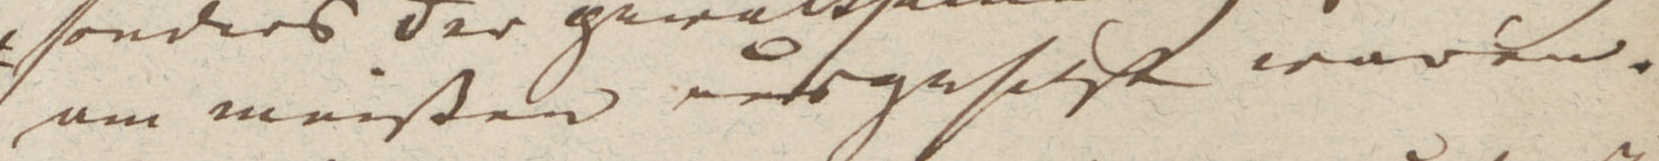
% am meisten ausgesetzt waren.
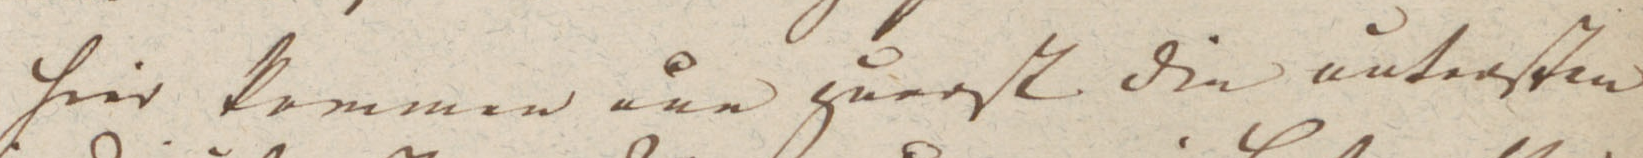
Hier kommen nun zuerst die untersten
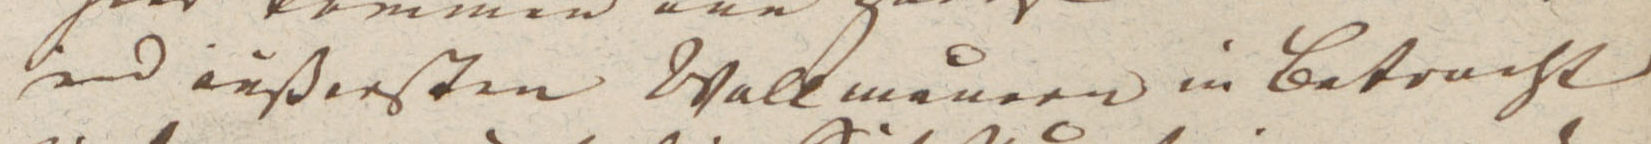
und äussersten Wallmauern in Betracht
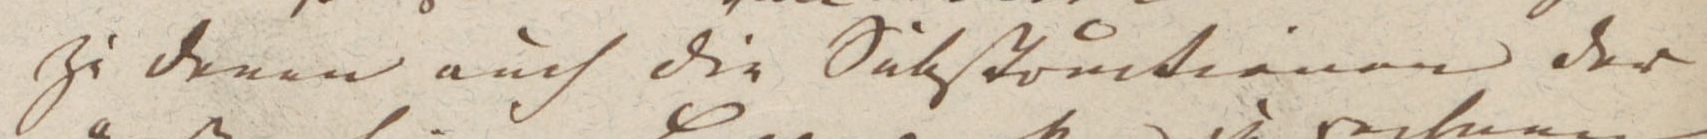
zu denen auch die Substructionen der
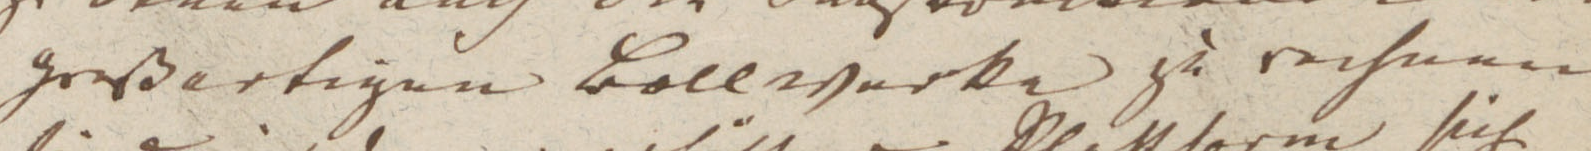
grossartigen Bollwerke zu rechnen
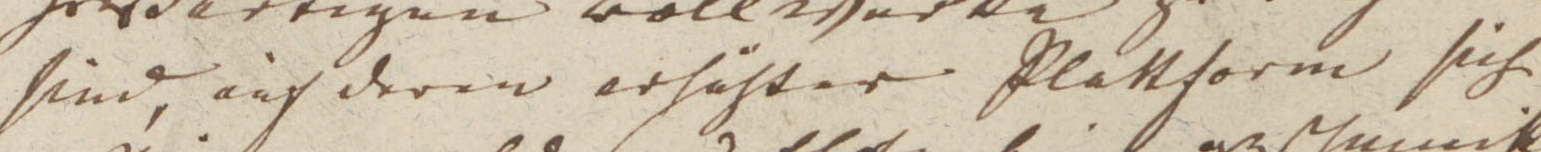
sind, auf deren erhöhter Plattform sich
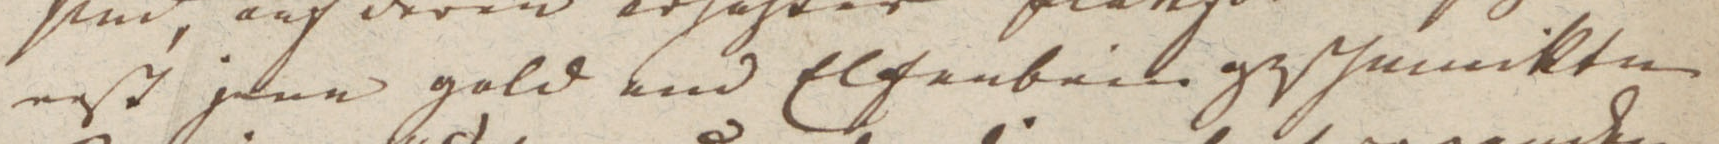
erst jene gold und Elfenbein geschmückten
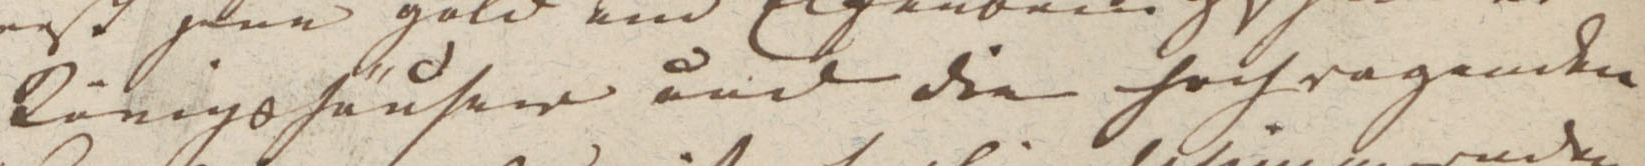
Königshäuser und die hochragenden
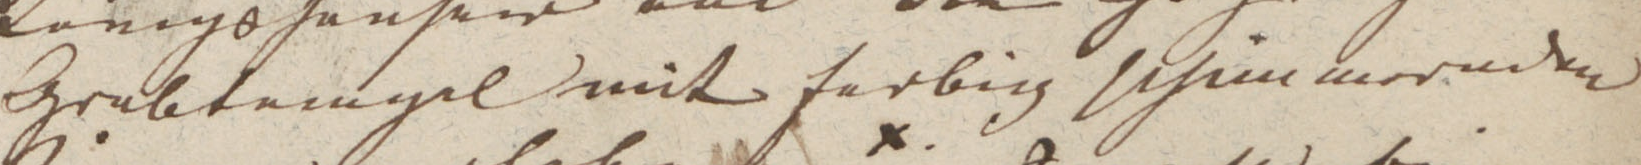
Grabtempel mit farbig schimmernden
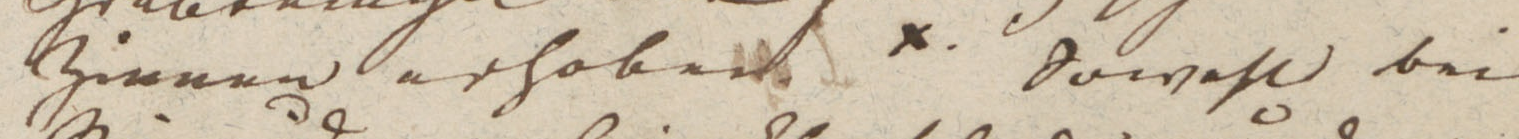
Zinnen erhoben. % Sowohl bei
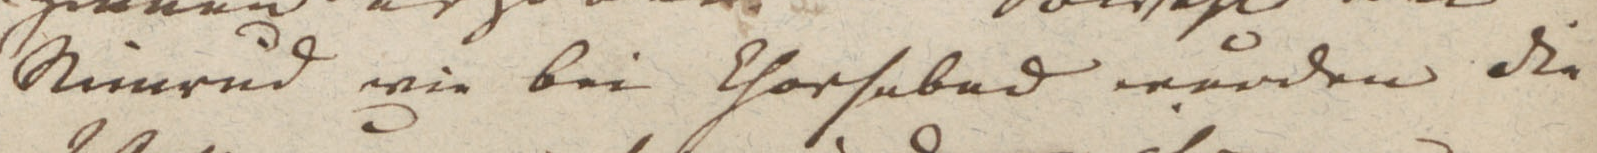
Nimrud wie bei Chorsabad wurden die
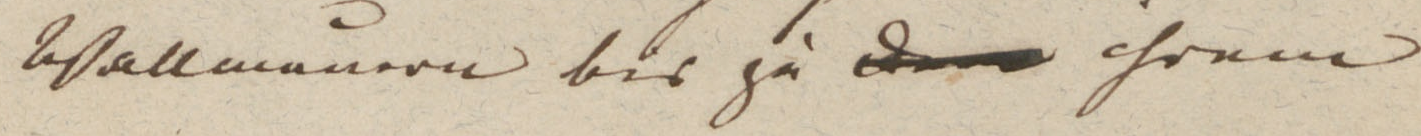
Wallmauern bis zu dem ihrem
